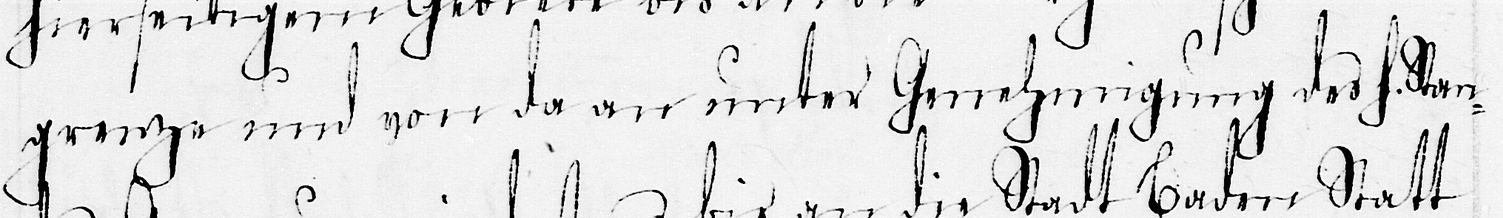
grenze und von da an unter Genehmigung des h. Stan¬
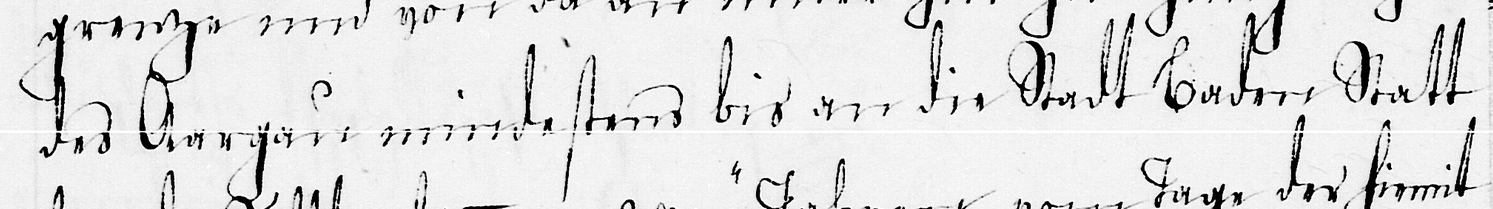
des Aargau mindestens bis an die Stadt Baden Statt
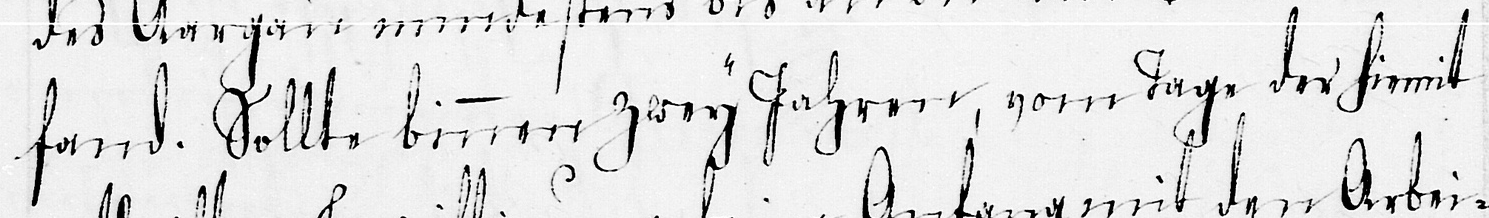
fand. Sollte binnen zwey Jahren, vom Tage der hiemit
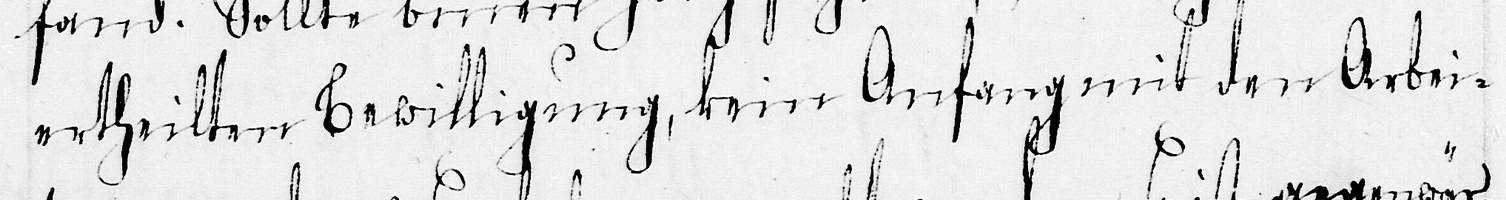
ertheilten Bewilligung, kein Anfang mit den Arbei¬
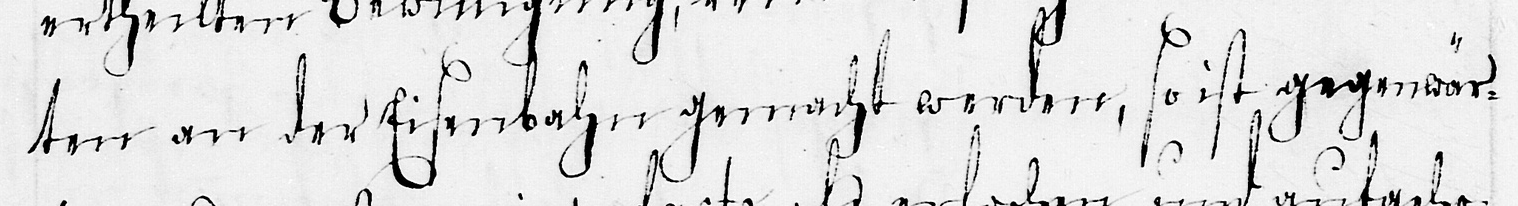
ten an der Eisenbahn gemacht werden, so ist gegenwär¬
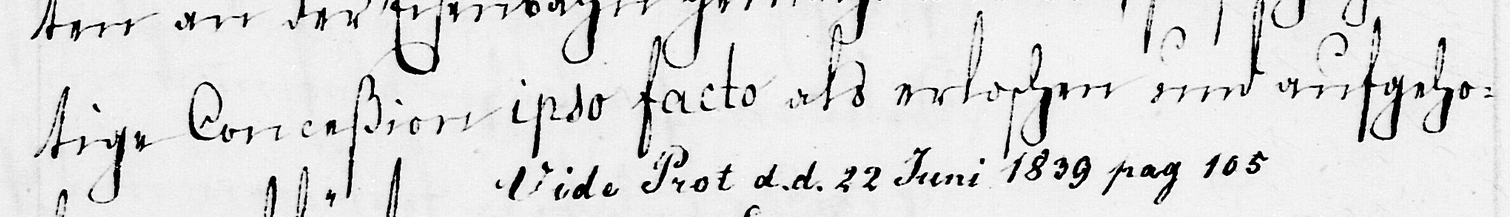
tige Conceßion ipso facto als erloschen und aufgeho¬
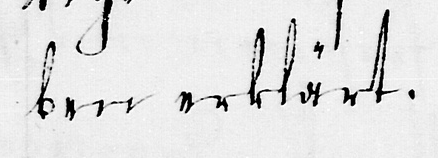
ben erklärt.
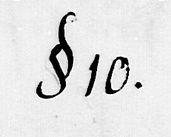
§. 10.
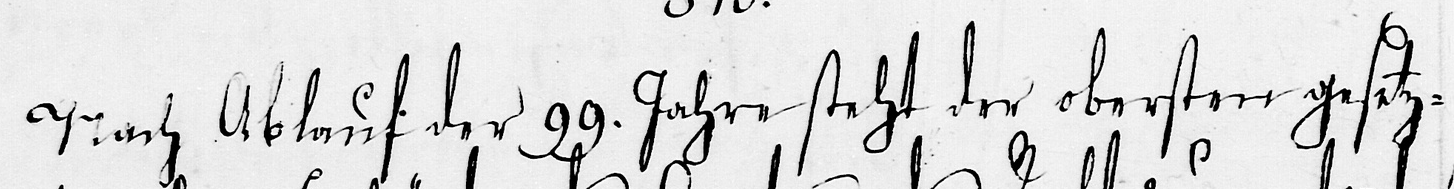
Nach Ablauf der 99. Jahre steht der obersten gesetz¬
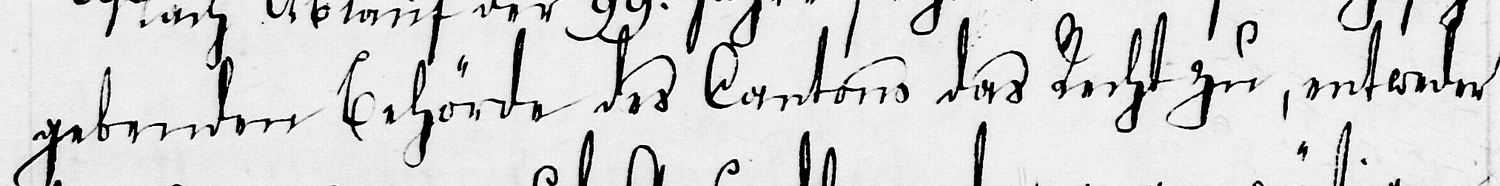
gebenden Behörde des Cantons das Recht zu, entweder
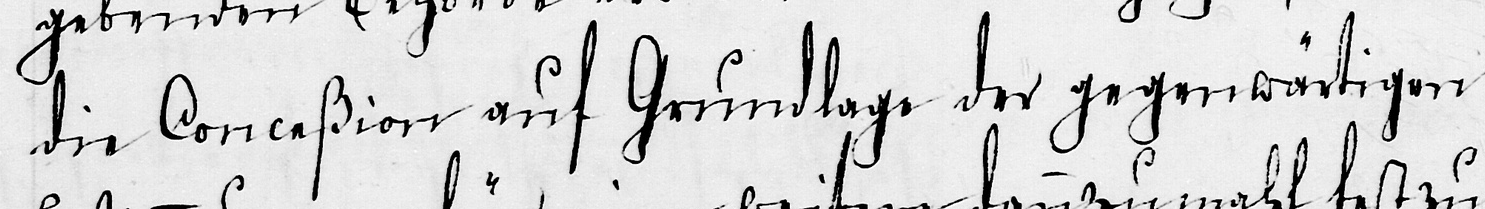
die Conceßion auf Grundlage der gegenwärtigen
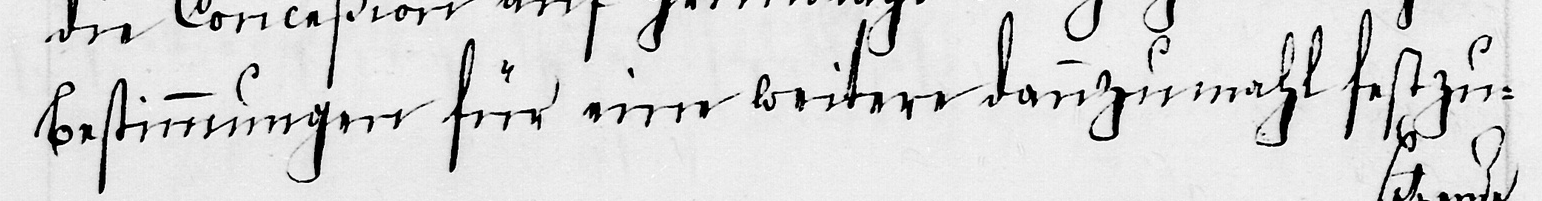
Bestimmungen für eine weitere dannzumahl festzu-
